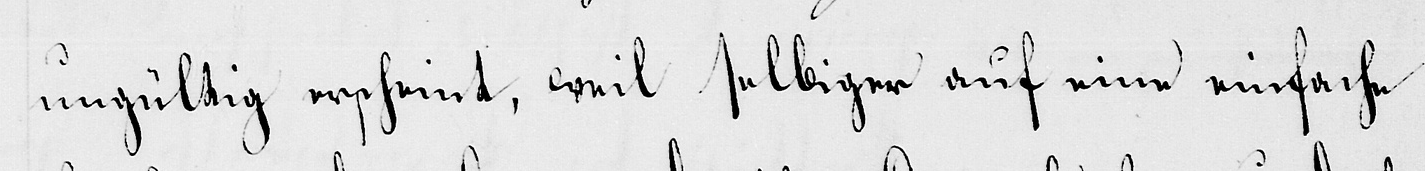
ungültig erscheint, weil selbiger auf eine einfache
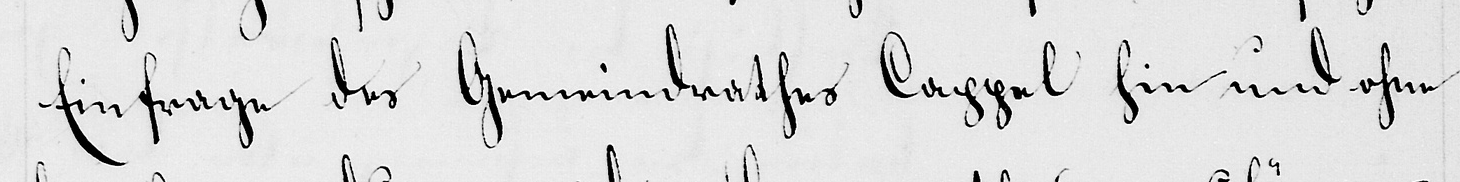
Einfrage des Gemeindrathes Cappel hin und ohne
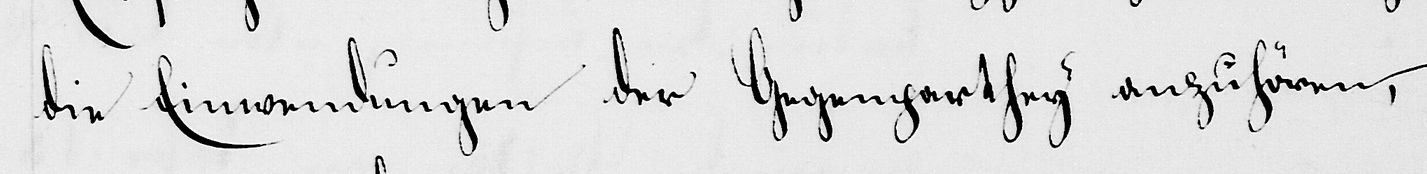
die Einwendungen der Gegenparthey anzuhören,
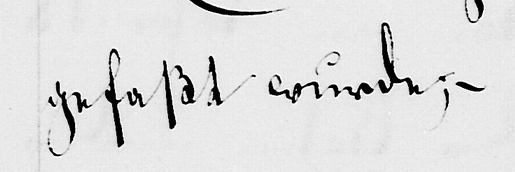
gefaßt wurde; –
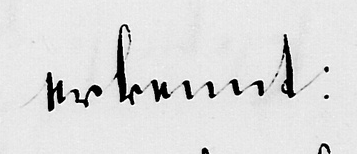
erkennt:
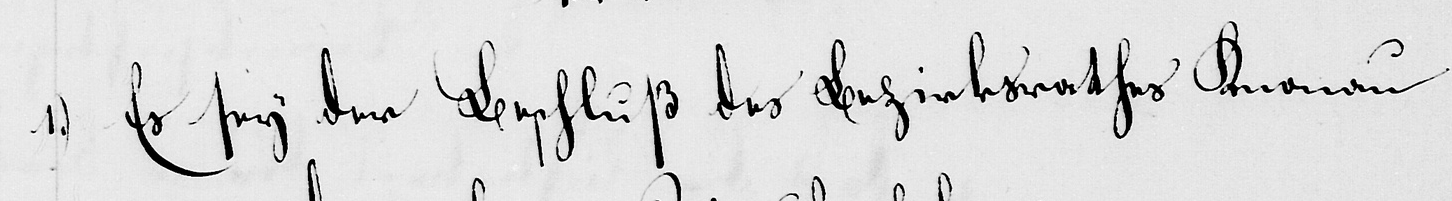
1.) Es sey der Beschluß des Bezirksrathes Knonau
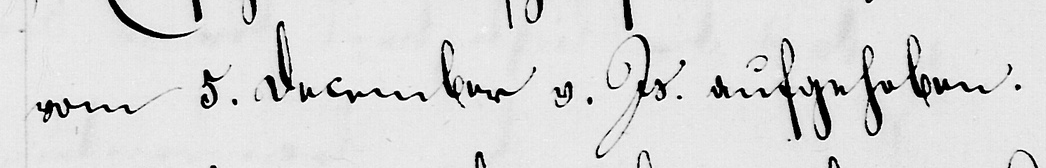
vom 5. Dezember v. Js. aufzuheben.
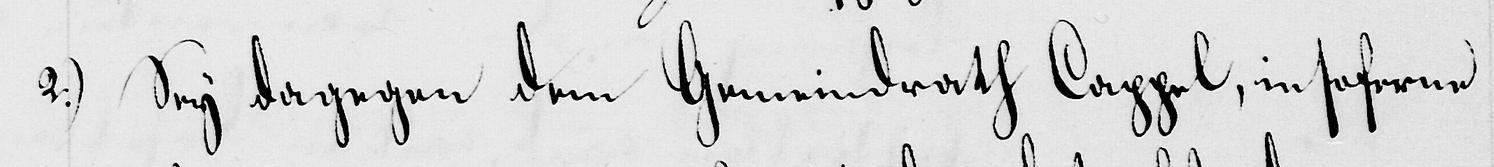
2.) Sey dagegen dem Gemeindrath Cappel, insoferne
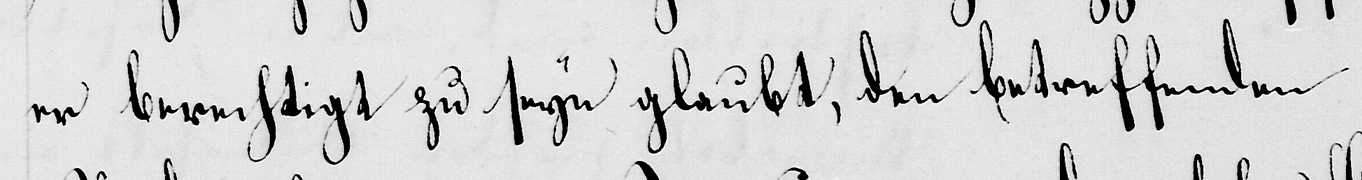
er berechtigt zu seyn glaubt, den betreffenden
